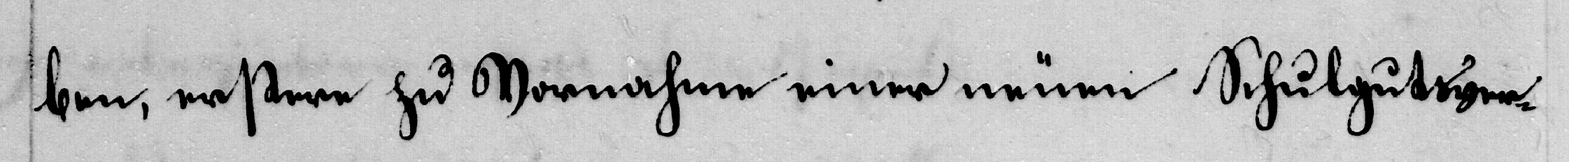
ben, erstere zu Vornahme einer neuen Schulgutsver¬
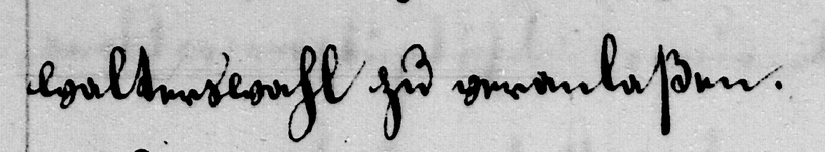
walterswahl zu veranlaßen.
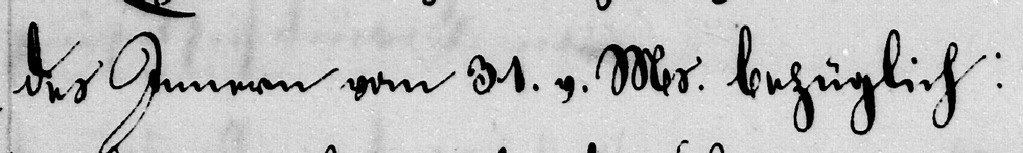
des Innern vom 31. v. Ms. bezüglich:
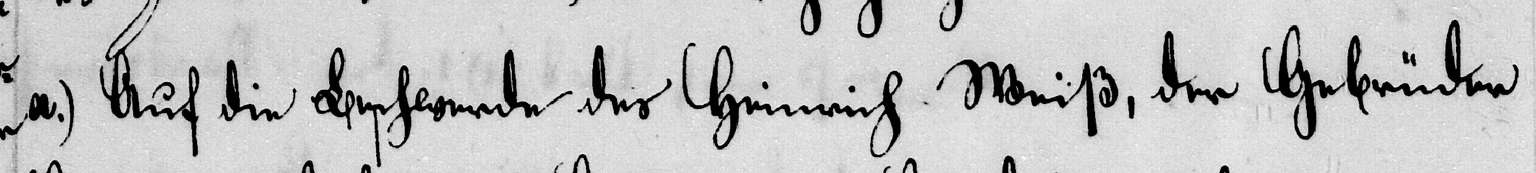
a.) Auf die Beschwerde des Heinrich Meiß, der Gebrüder
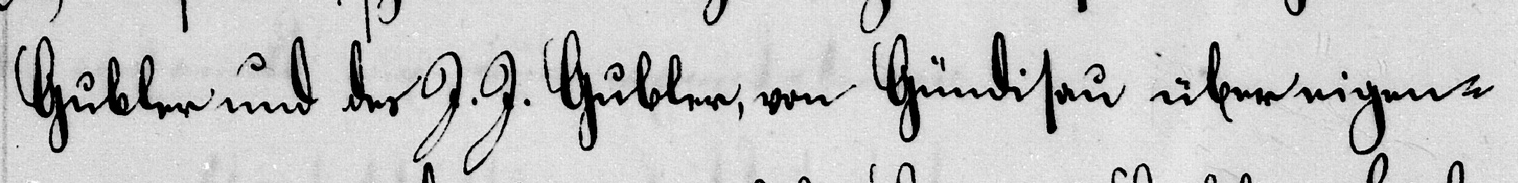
Gubler und des J. J. Gubler, von Gündisau über eigen¬
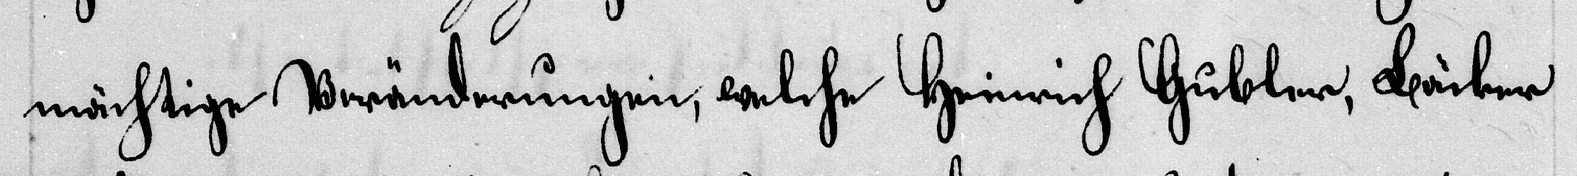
mächtige Veränderungen, welche Heinrich Gubler, Bäcker
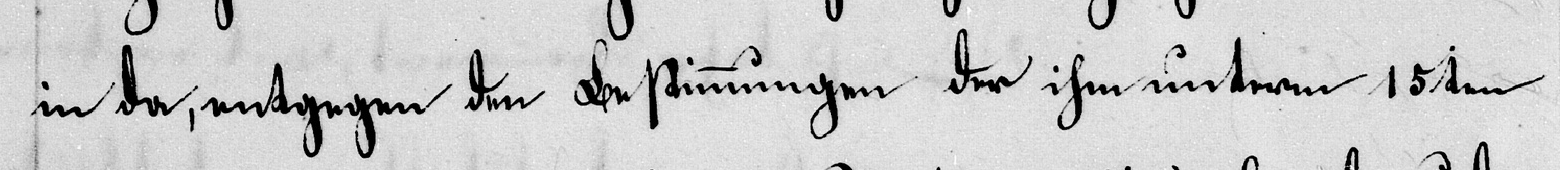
in da, entgegen den Bestimmungen der ihm unterm 15ten
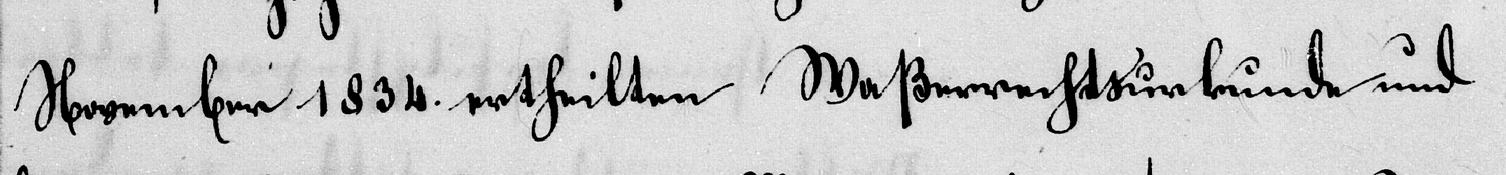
November 1834. ertheilten Waßerrechtsurkunde und
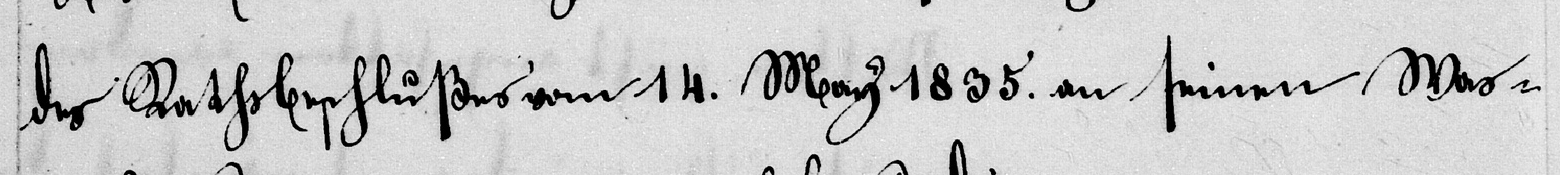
des Rathsbeschlußes vom 14. May 1835. an seinen Waß¬
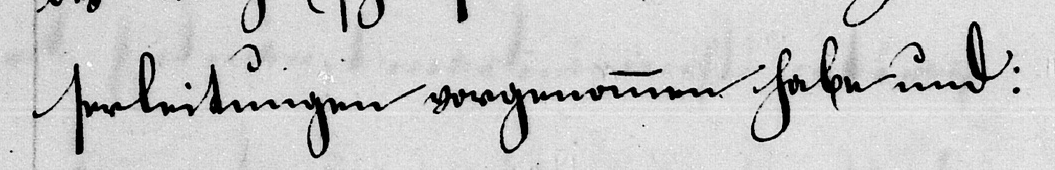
erleitungen vorgenommen habe und:
